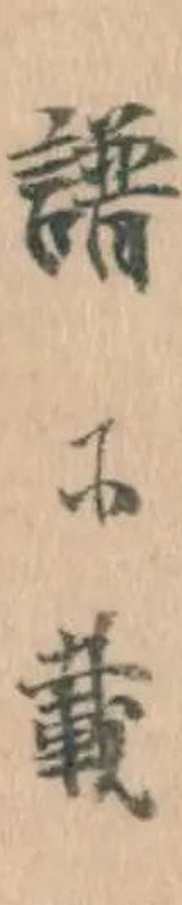譜に載
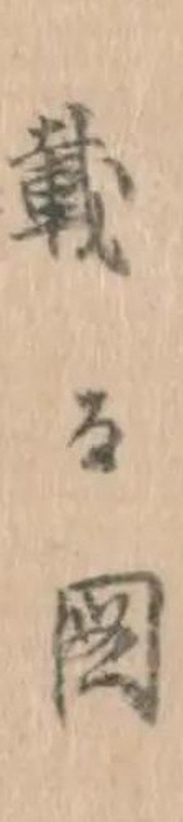載る図

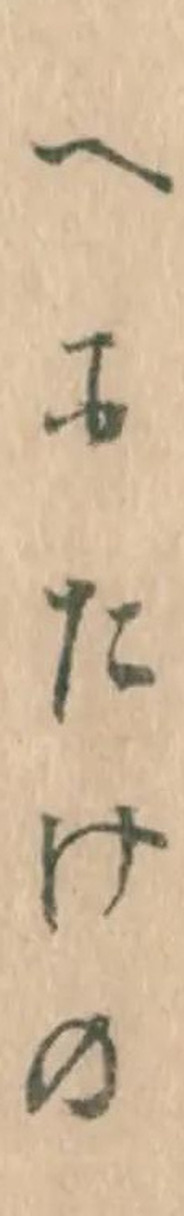へにたけの
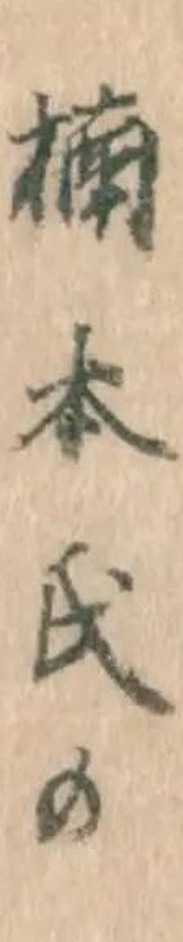楠本氏の
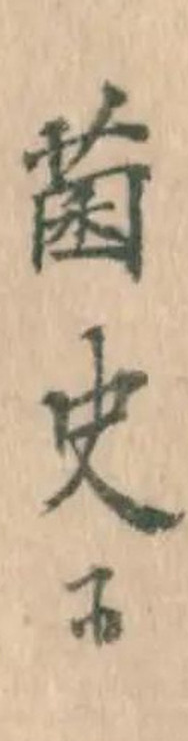菌史に
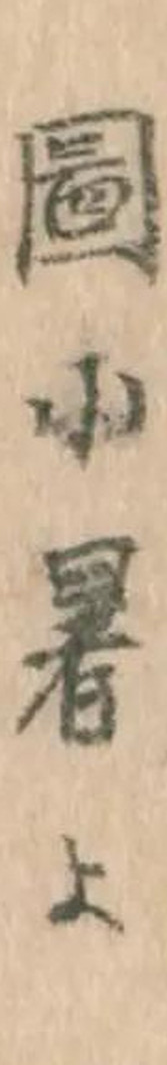図小暑よ
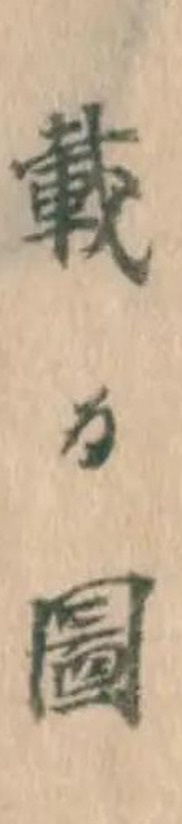載る図
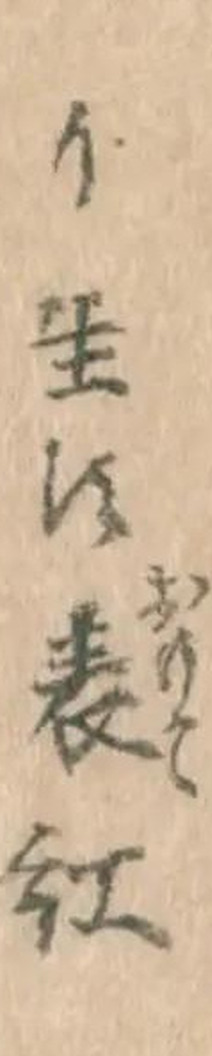り生す表紅
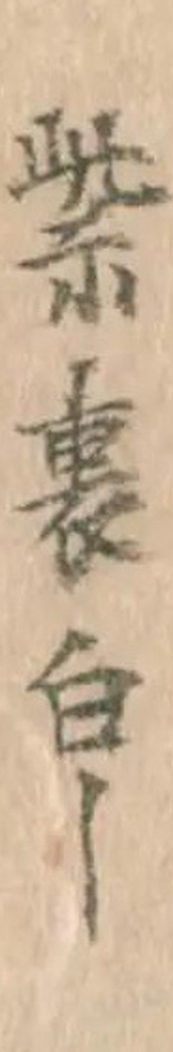紫裏白し
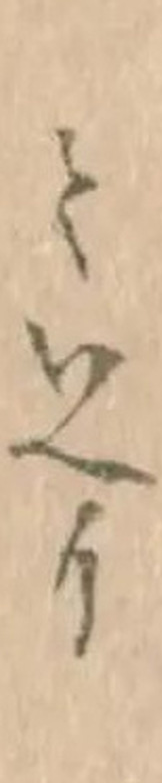といへり
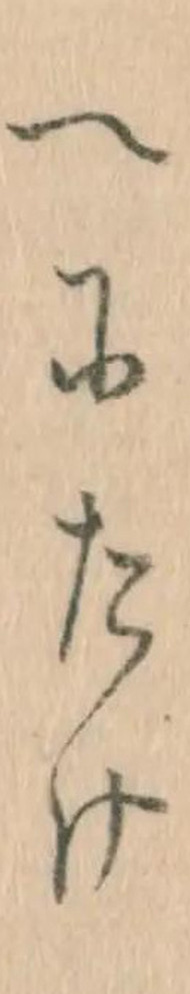へにたけ
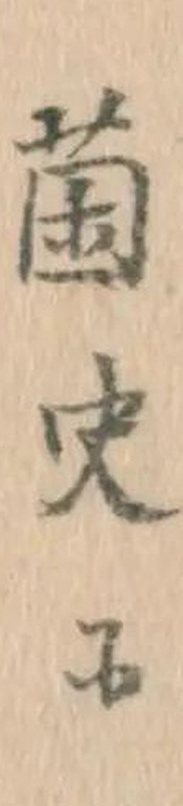菌史に
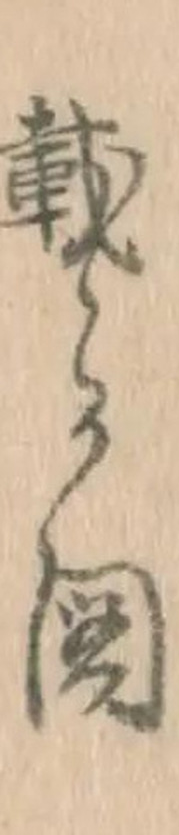載る図

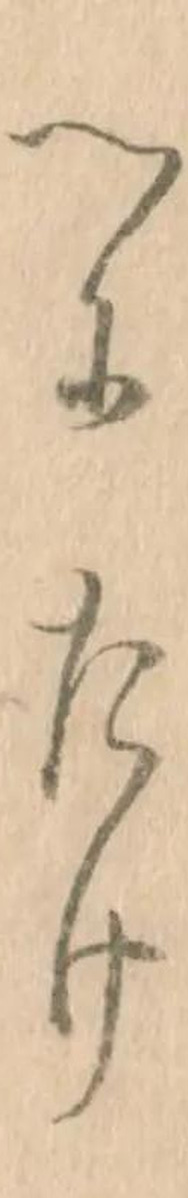へにたけ
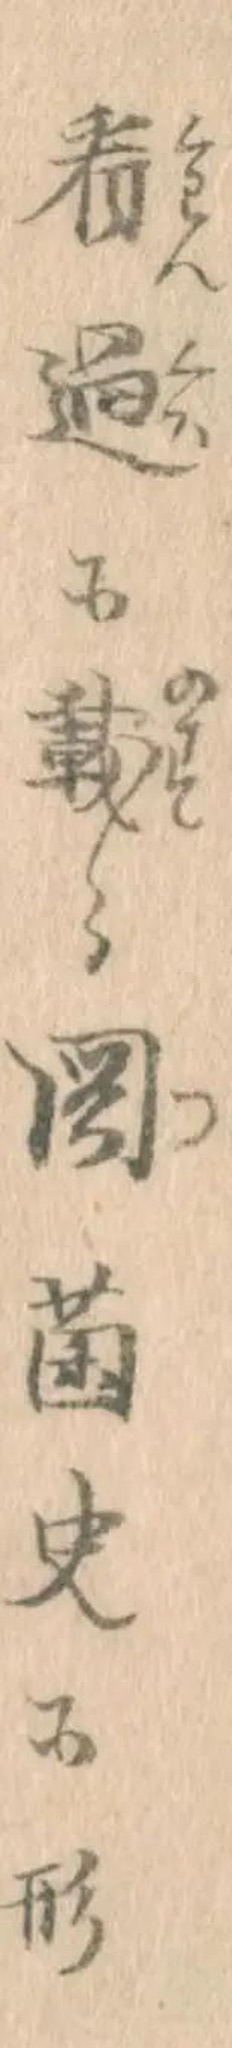看過に載る図菌史に形
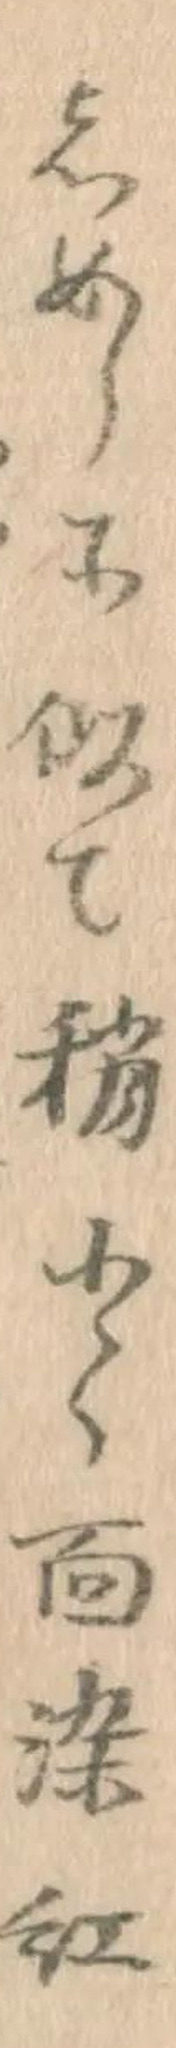しめしに似て稍小く面染紅
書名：本草図譜. 巻58-60
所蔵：国立国会図書館 National Diet Library, JAPAN
